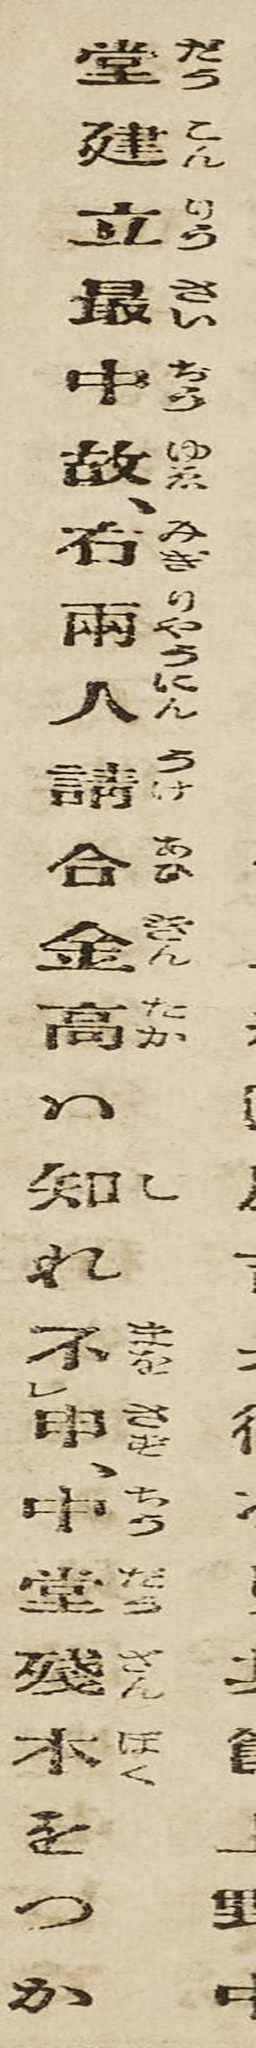堂建立最中故、右両人請合金高は知れ不申、中堂残木をつか
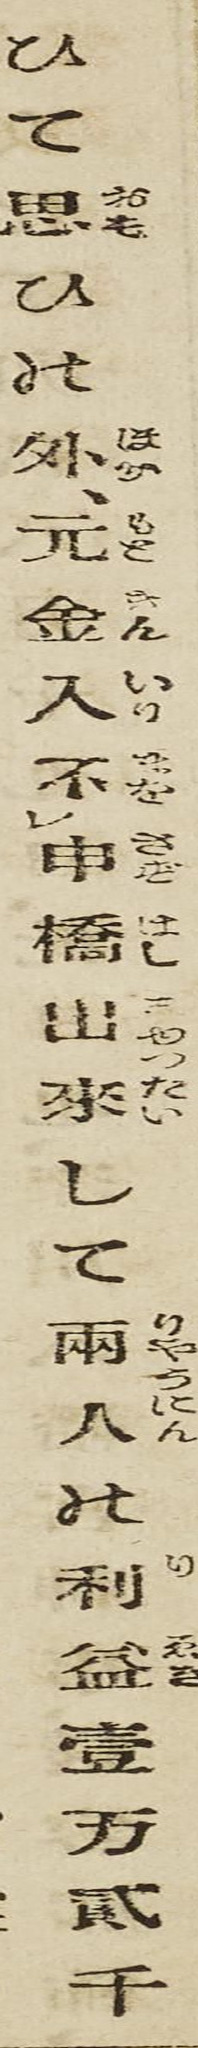ひて思ひの外、元金入不申橋出来して両人の利益壹万貳千
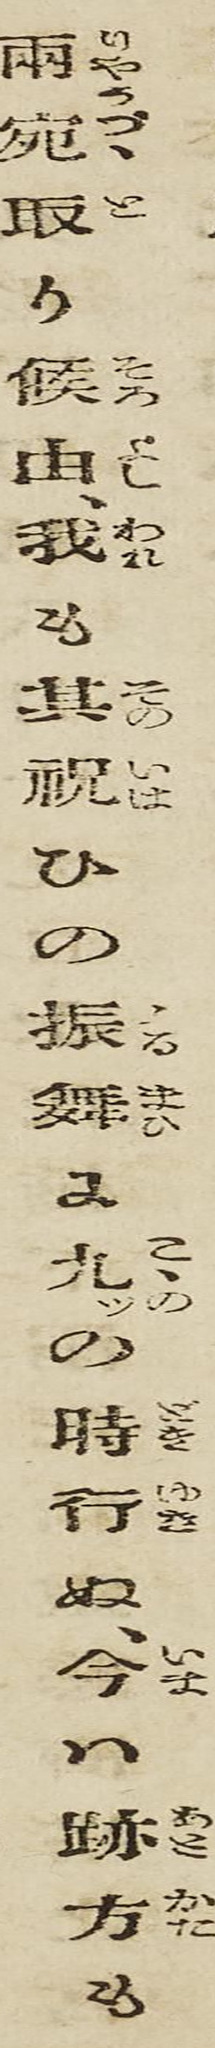両宛、取り候由、我も其祝ひの振舞に九ツの時行ぬ、今は跡方も
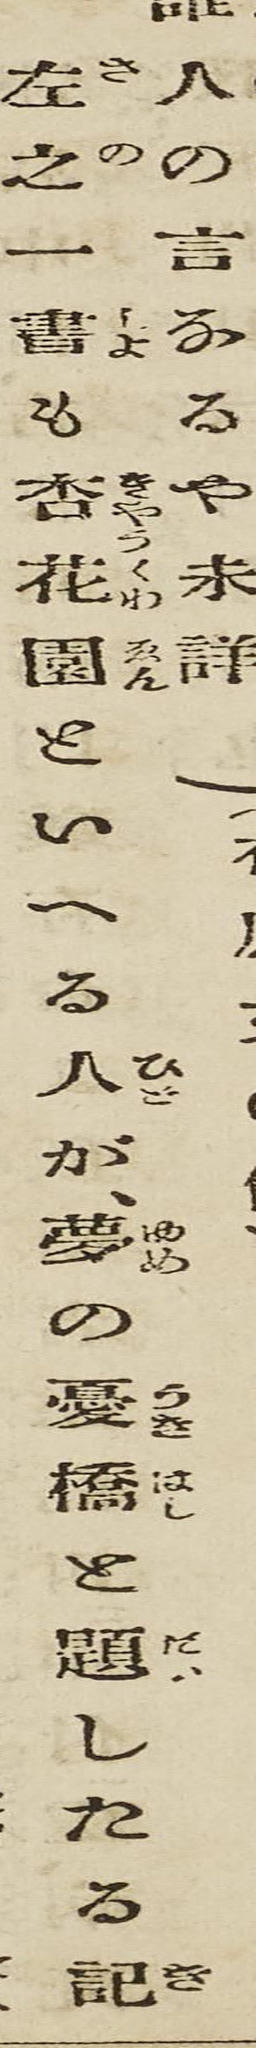左之一書も杏花園といへる人が、夢の憂橋と題したる記
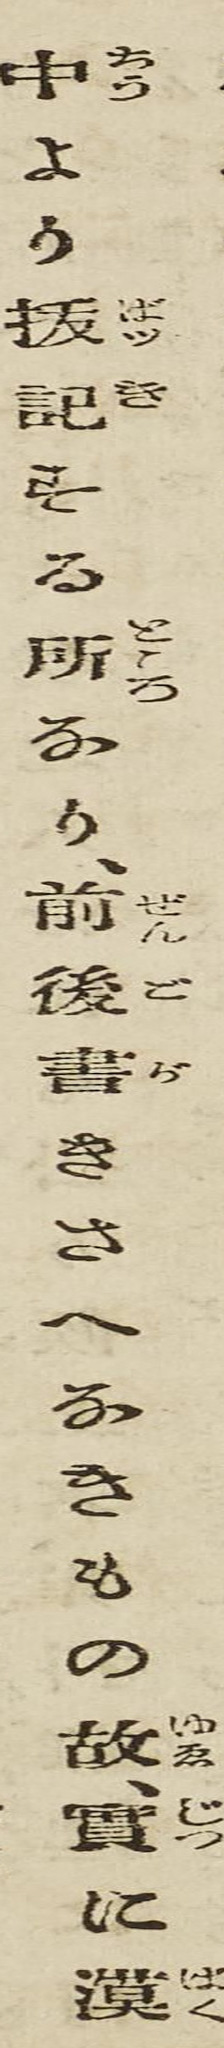中より抜記する所なり、前後書きさへなきもの故、実に漠
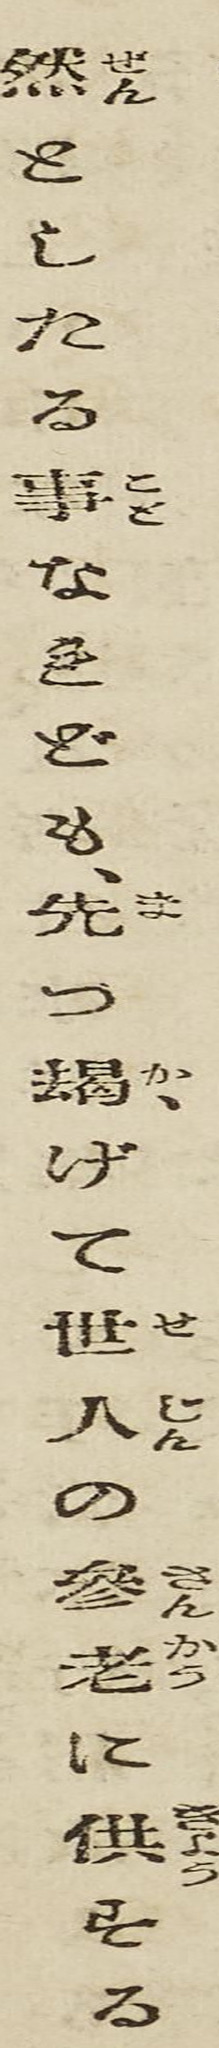然としたる事なれども、先づ朅げて世人の参老に供する
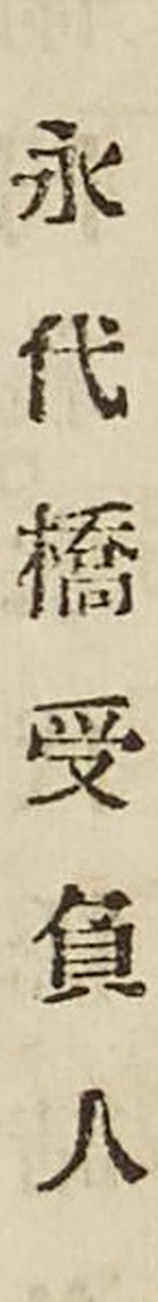永代橋受負人
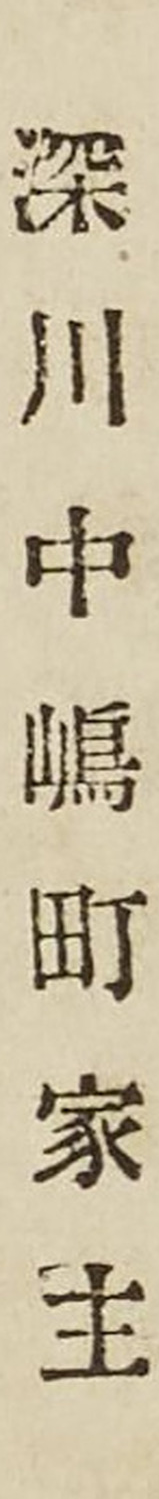深川中島町家主
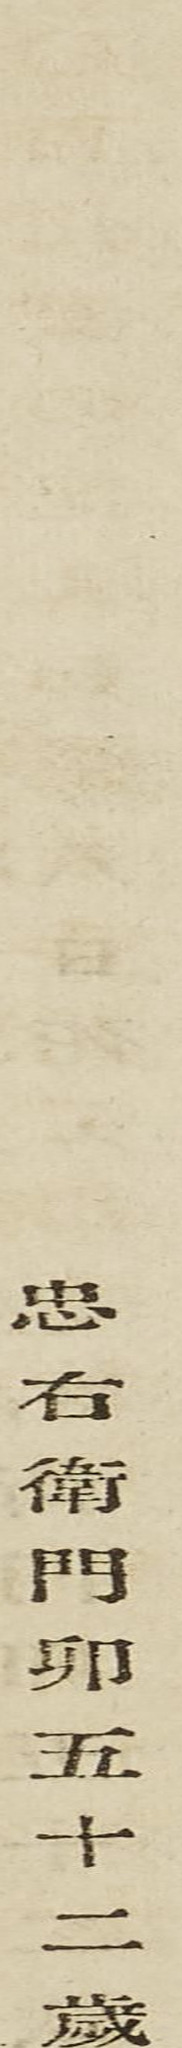忠右衛門卯五十二歳
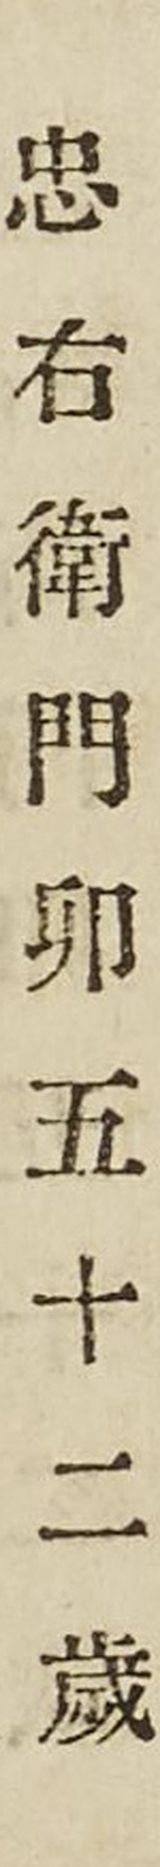忠右衛門卯五十二歳
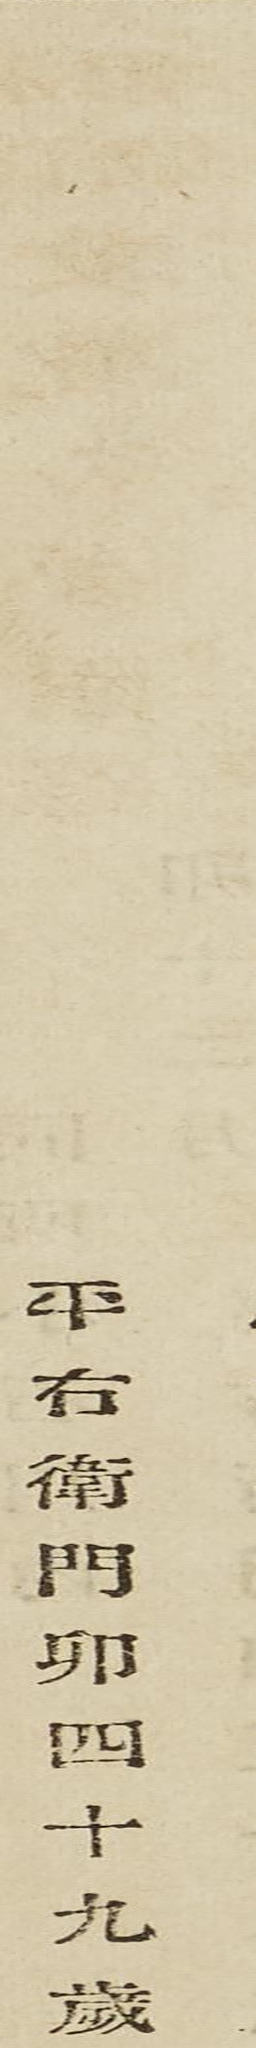平右衛門卯四十九歳
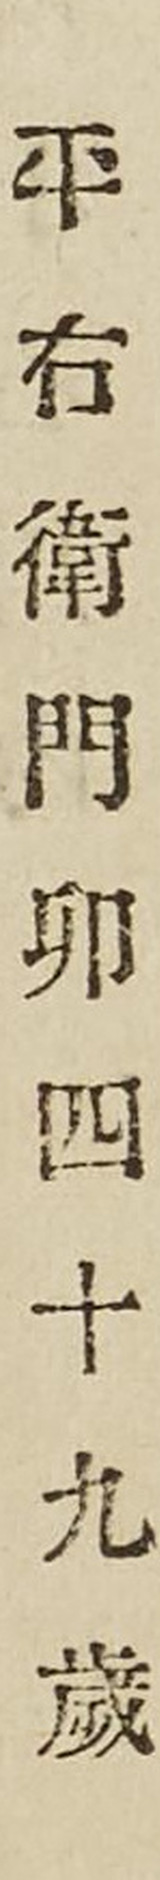平右衛門卯四十九歳

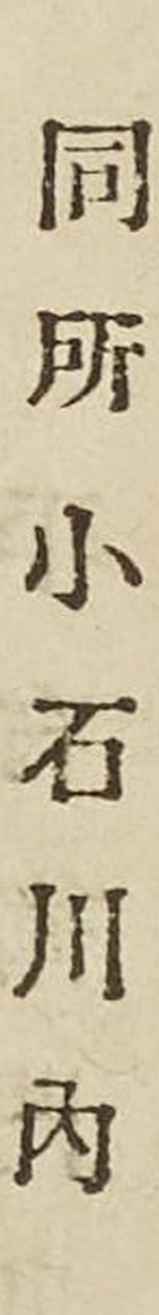同所小石川内
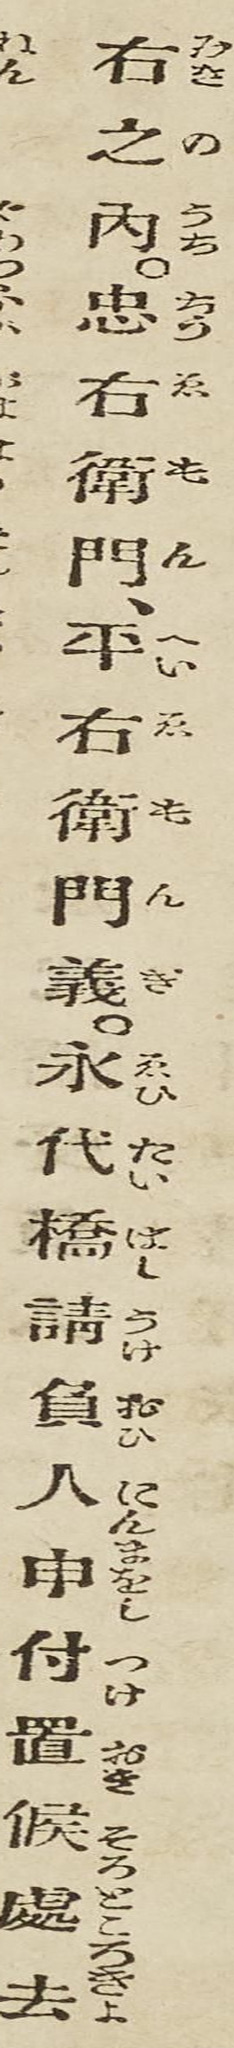右之内。忠右衛門、平右衛門義。永代橋請負人申付置候処去
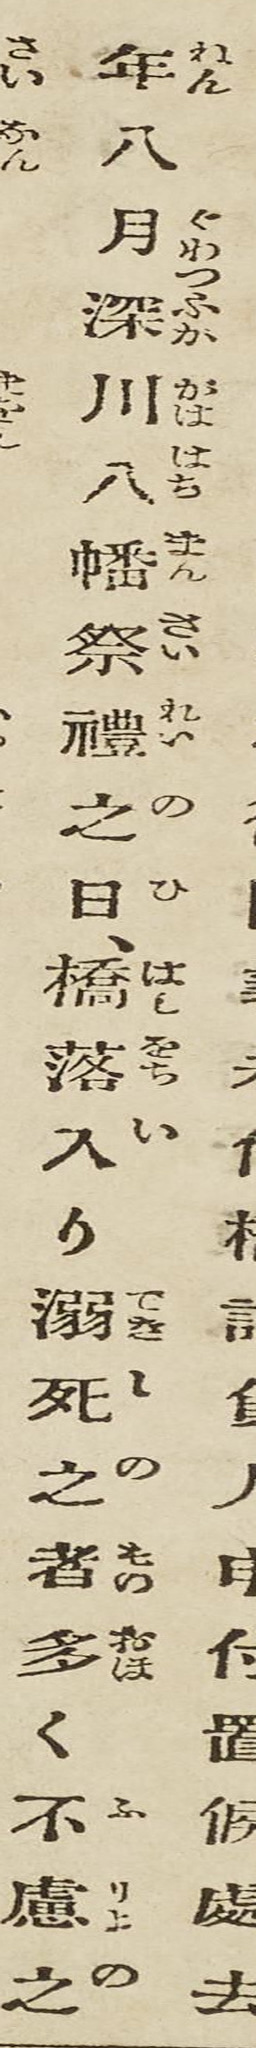年八月深川八幡祭礼之日、橋落入り溺死之者多く不慮之
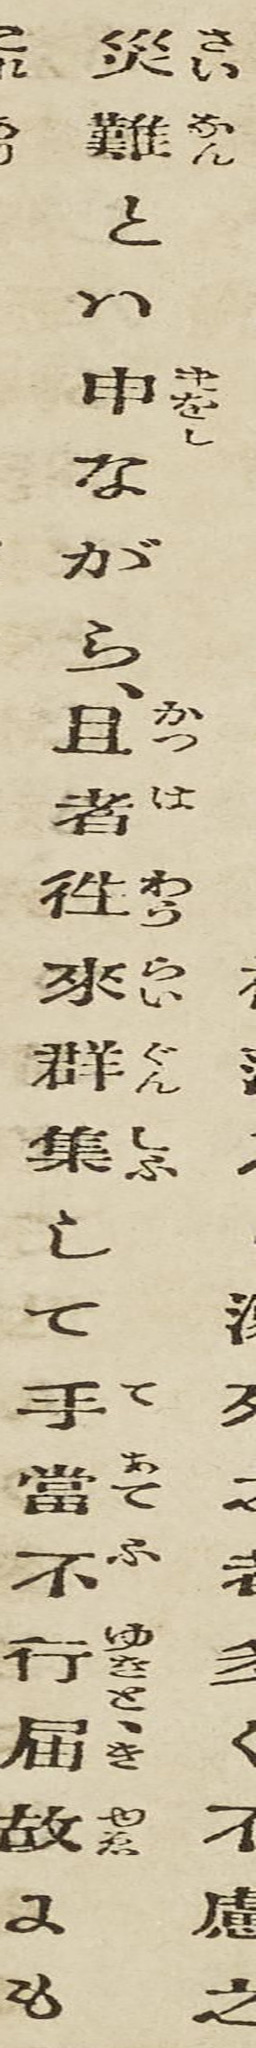災難とは申ながら、且者往来群集して手当不行届故にも
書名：永代惨話　文化の夢　全
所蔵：東京大学地震研究所図書室 Earthquake Research Institute Library, The University of Tokyo, JAPAN
